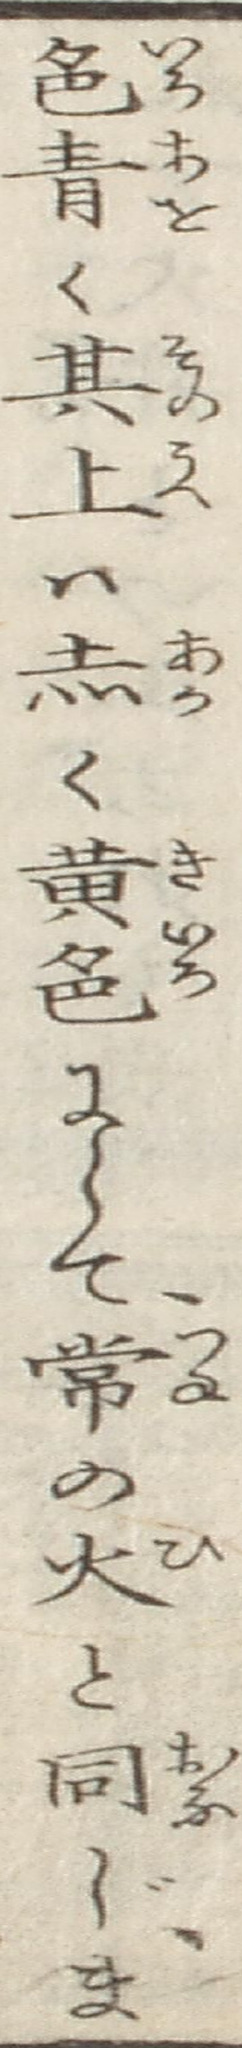色青く其上は赤く黄色にして、常の火と同じ、ま
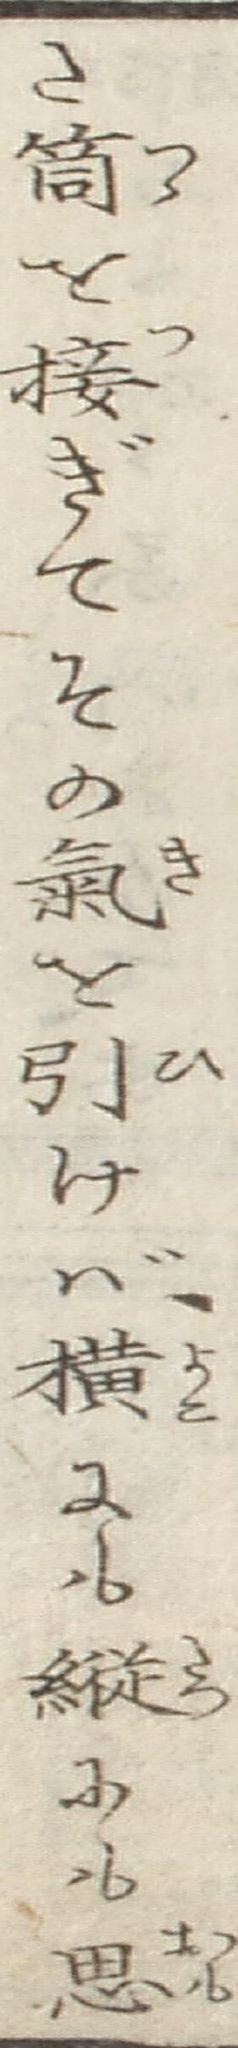た筒を接ぎてその気を引けば、横にも縦にも思
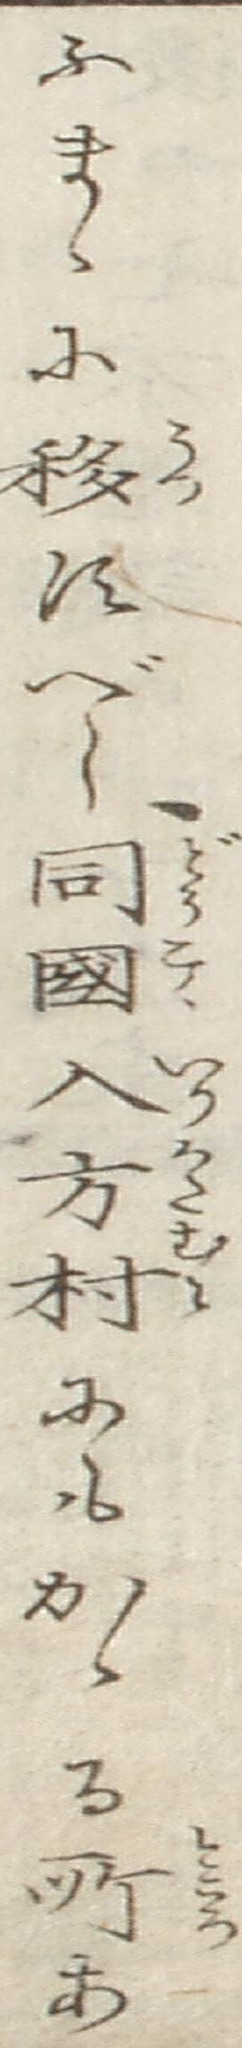ふまゝに移すべし、同国入方村にもかゝる所あ
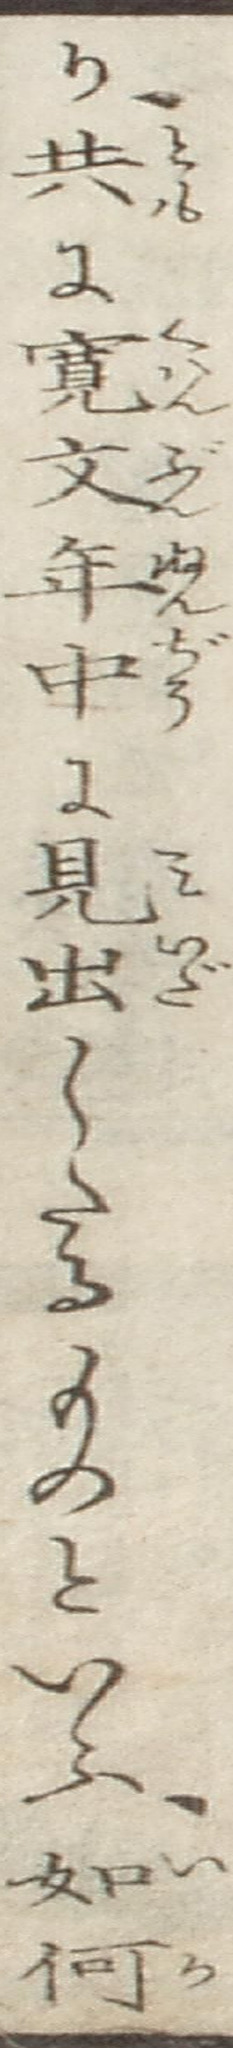り、共に寛文年中に見出したるものといふ、如何

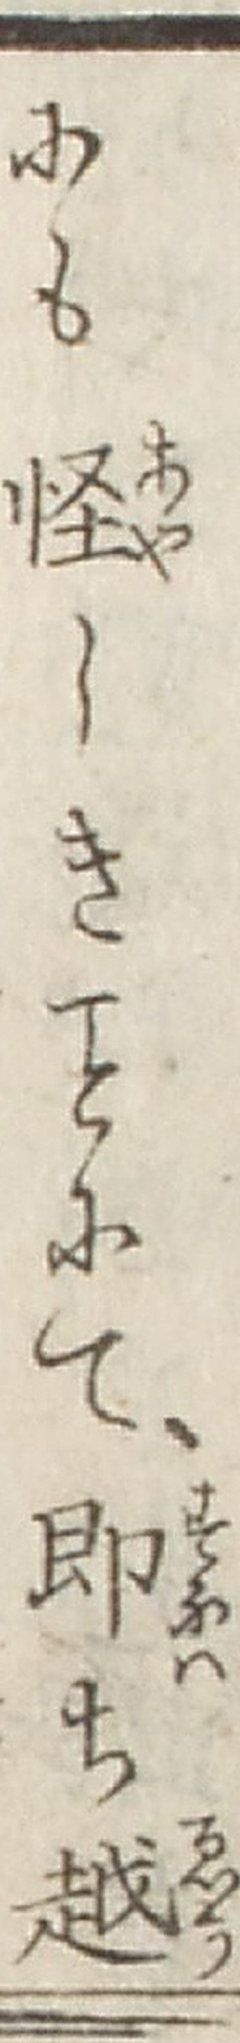にも怪しきことにて、即ち越
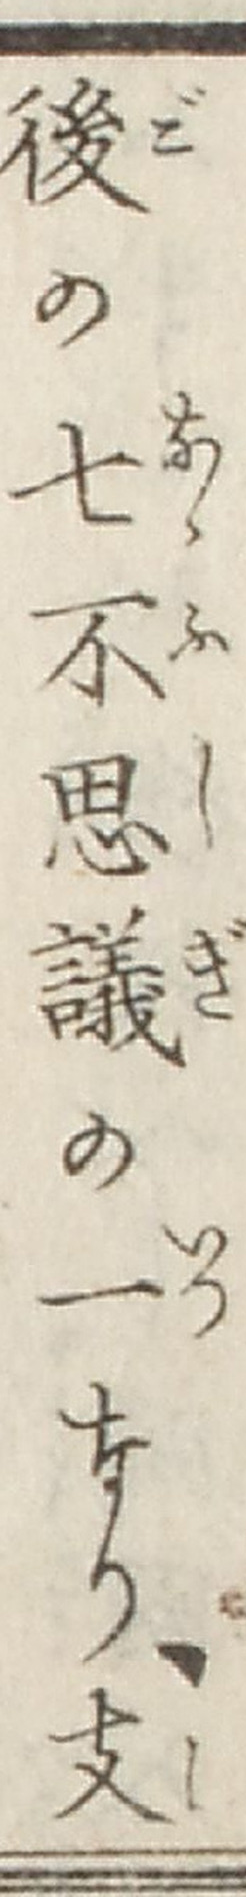後の七不思議の一なり、支
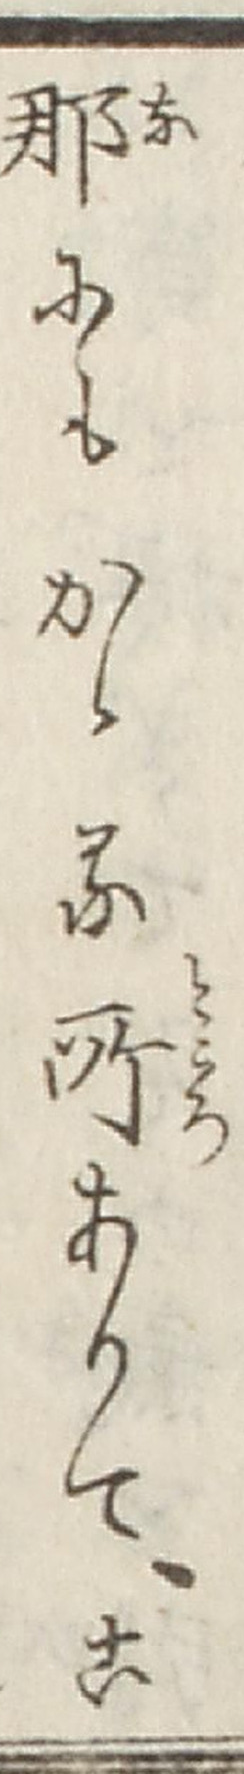那にもかゝる所ありて、こ
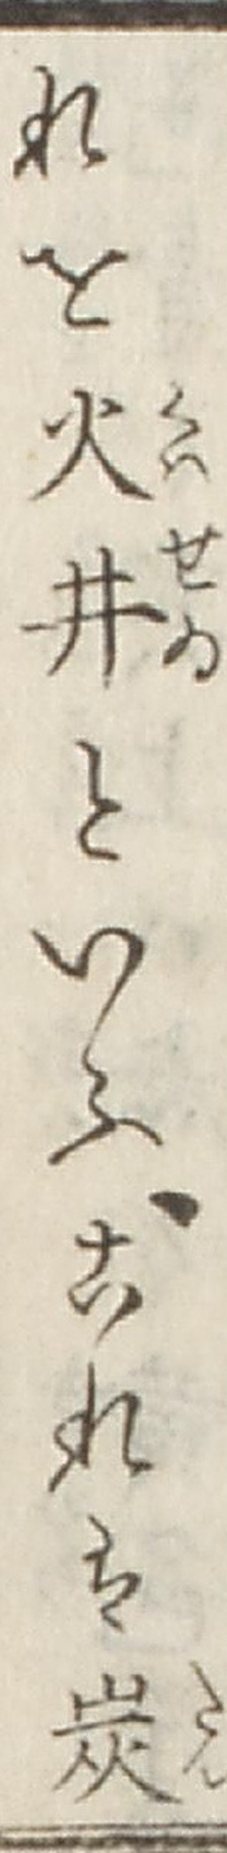れを火井といふ、これは炭
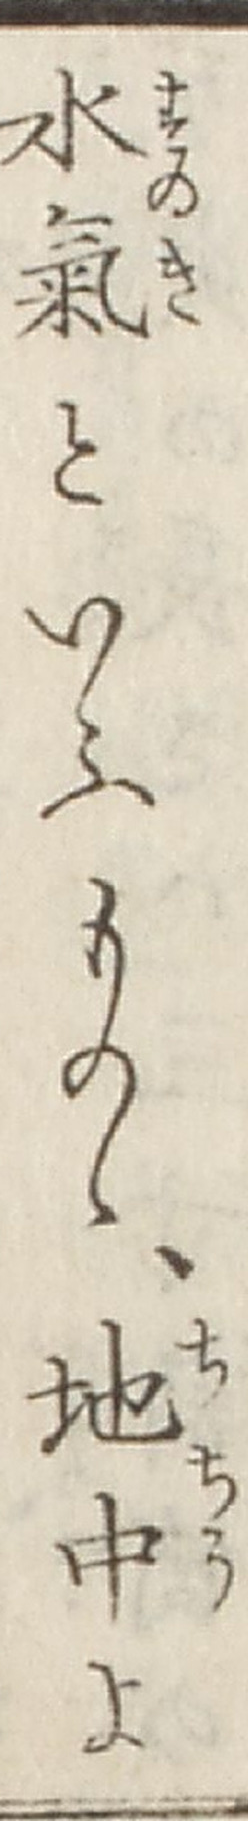水気といふものゝ、地中よ
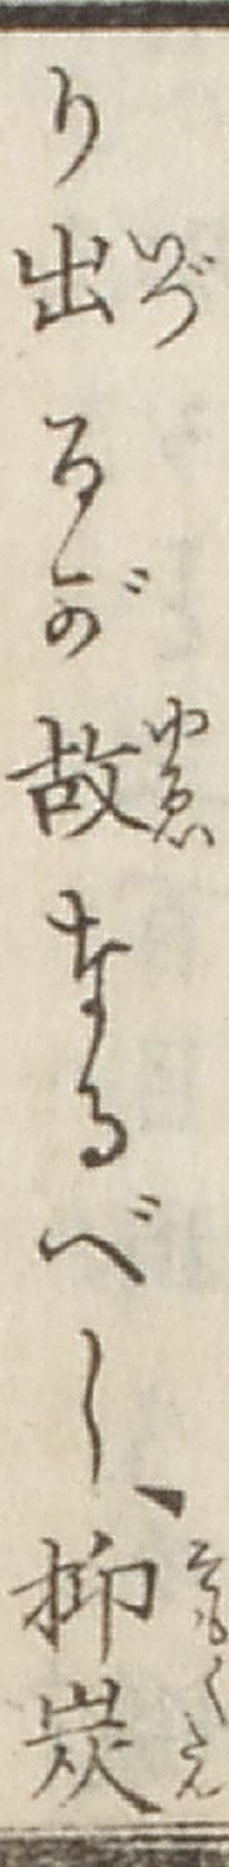り出るが故なるべし、抑炭
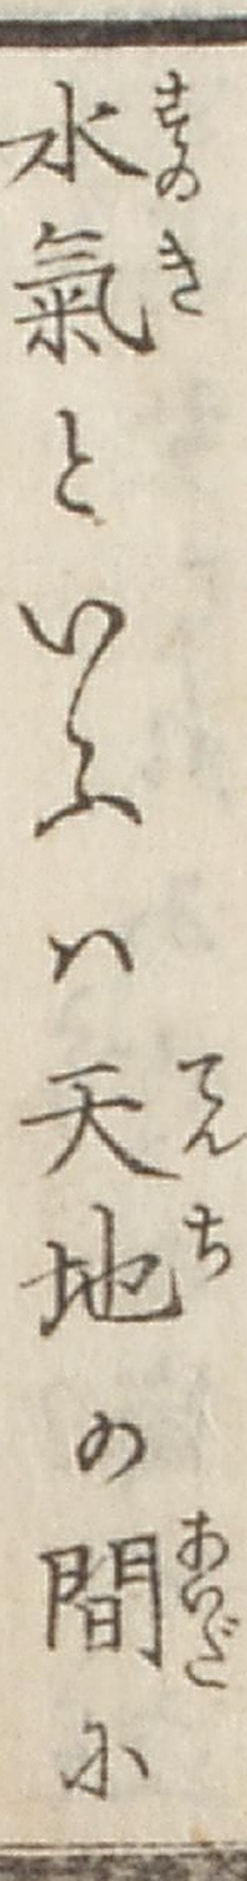水気といふは天地の間に
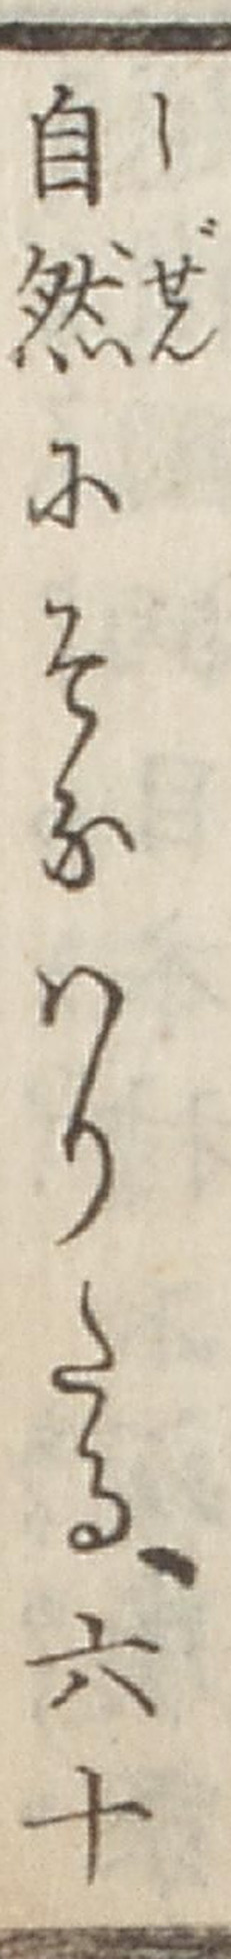自然にそなはりたる、六十
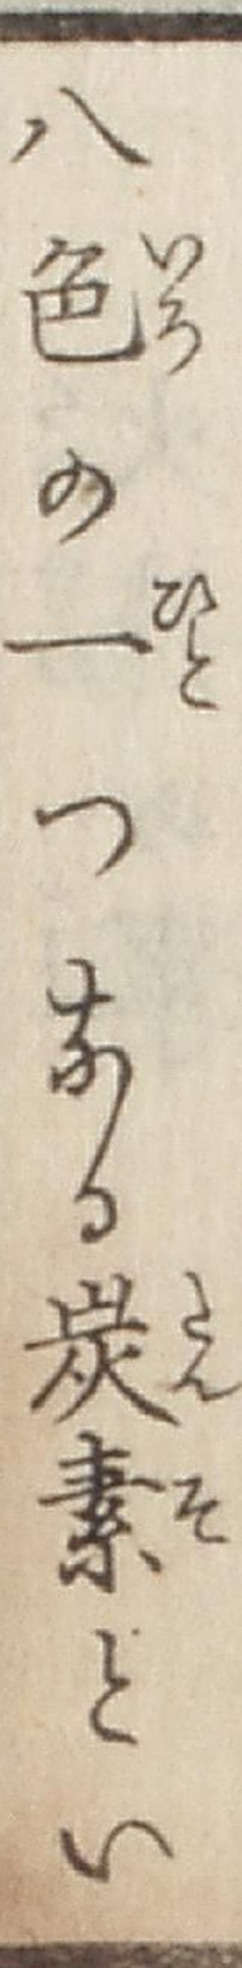八色の一つなる炭素とい
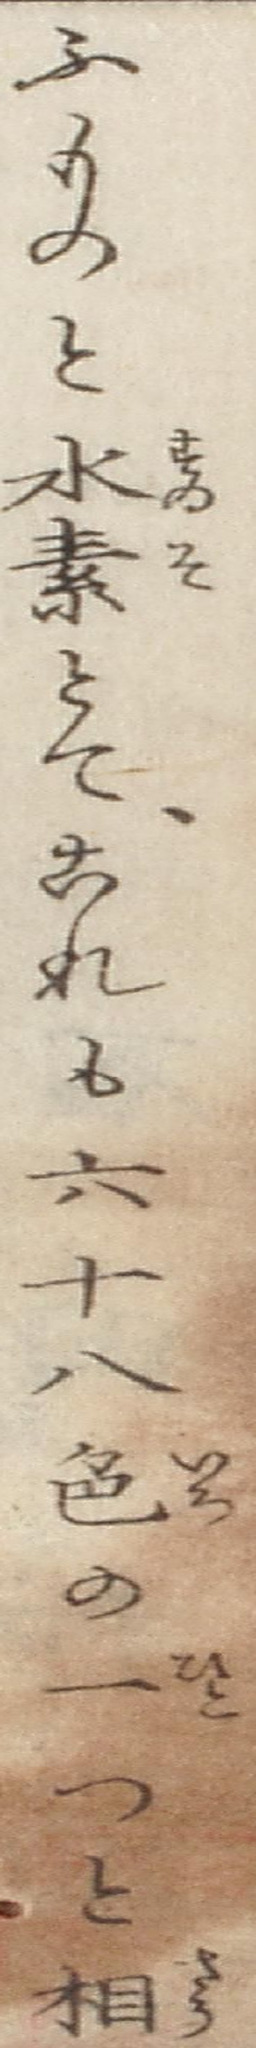ふものと水素とて、これも六十八色の一つと相
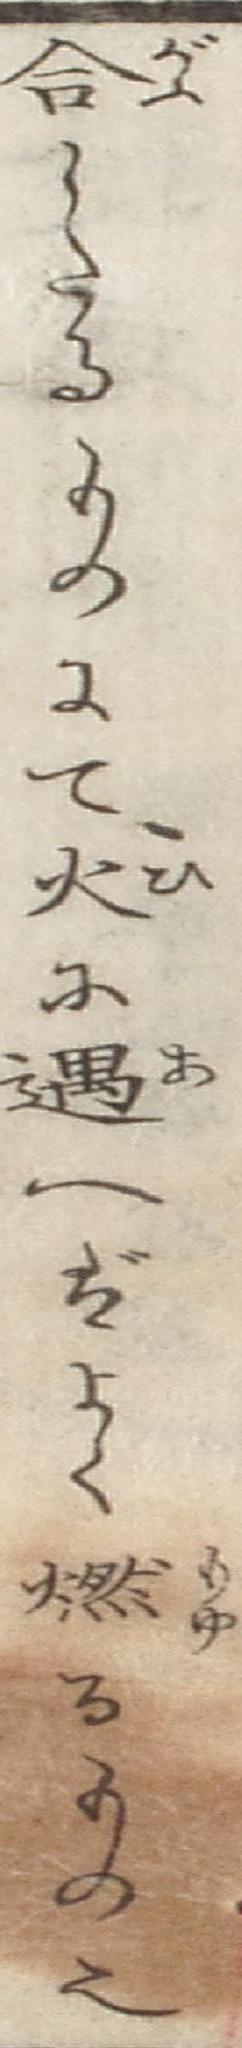合したるものにて、火に遇へばよく燃るもの也
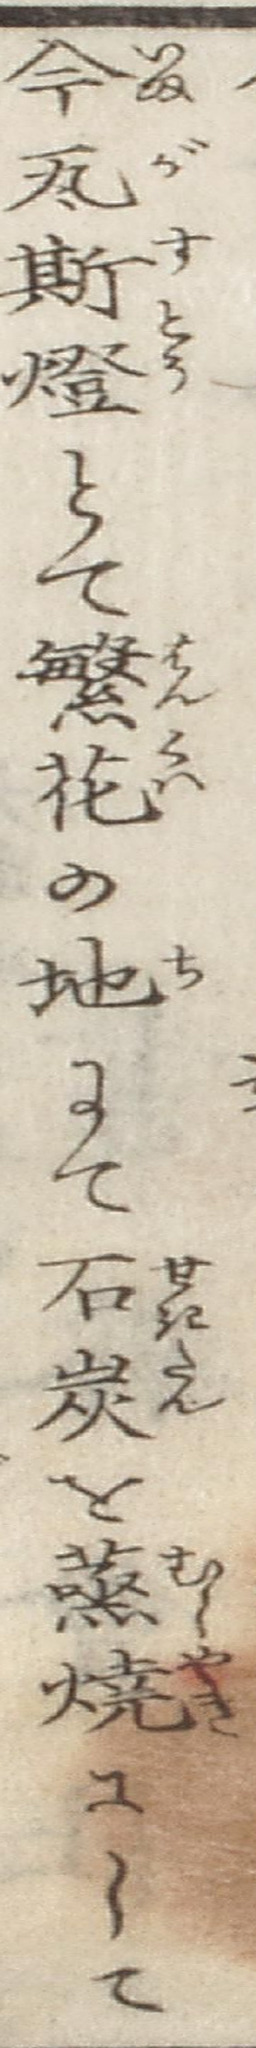今瓦斯燈とて繁花の地にて石炭を蒸焼にして
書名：変異辯　一名、天變地異拾遺　全
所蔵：東京大学地震研究所図書室 Earthquake Research Institute Library, The University of Tokyo, JAPAN
